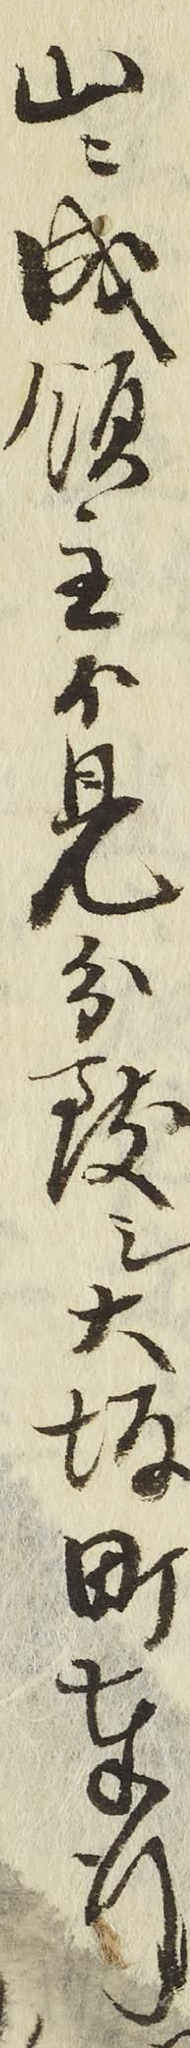山二成領主ゟ見分致ㇱ大坂町奉行へ
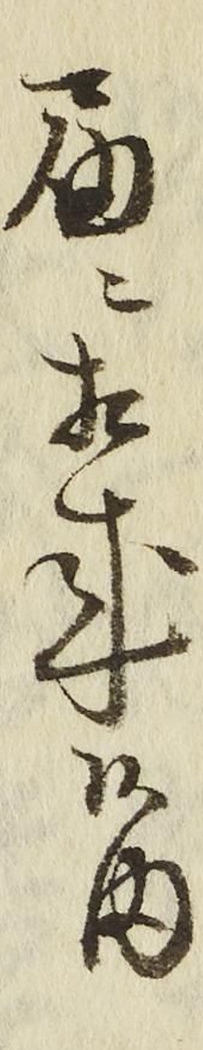届二相成候由
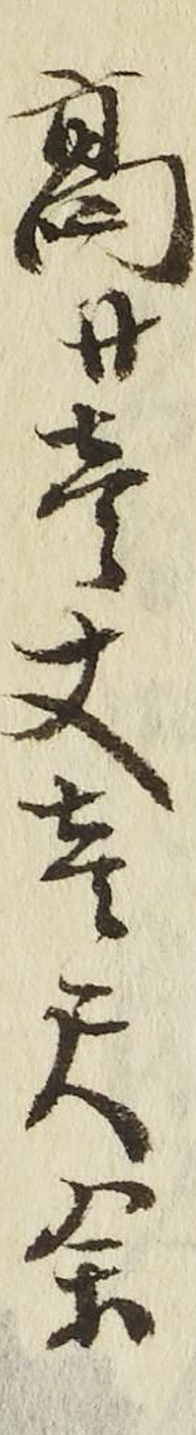高サ壱丈壱尺余
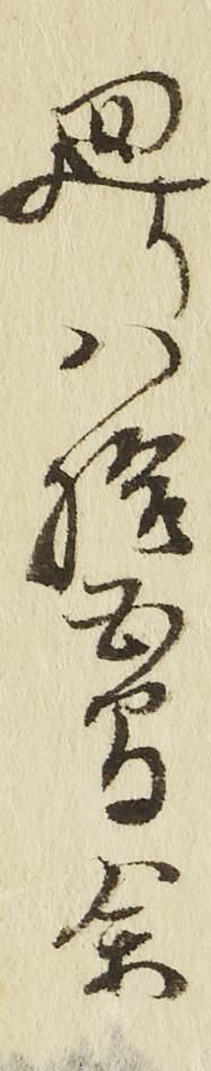廻り八拾五間余

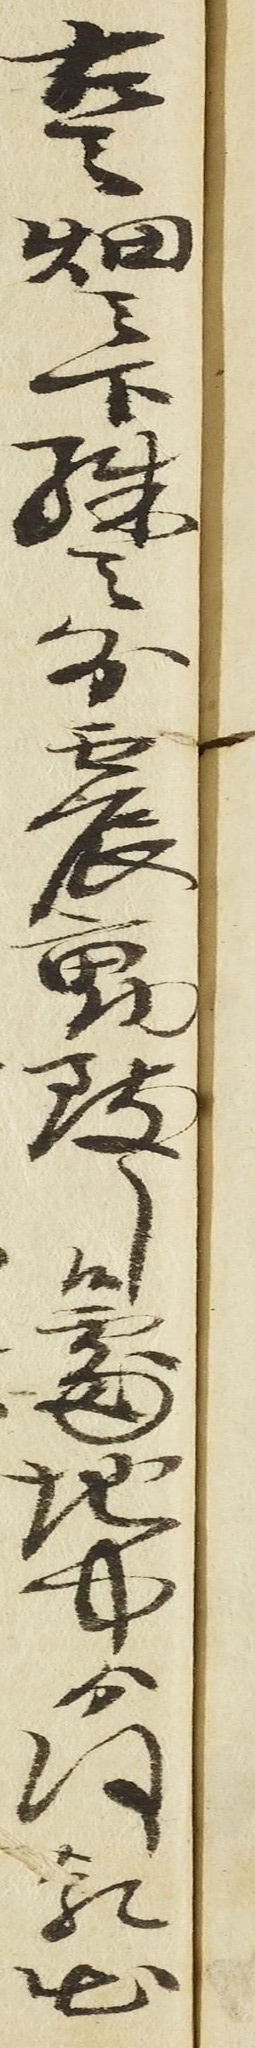右之畑之下殊之外震動致し候処地中ゟ何か出
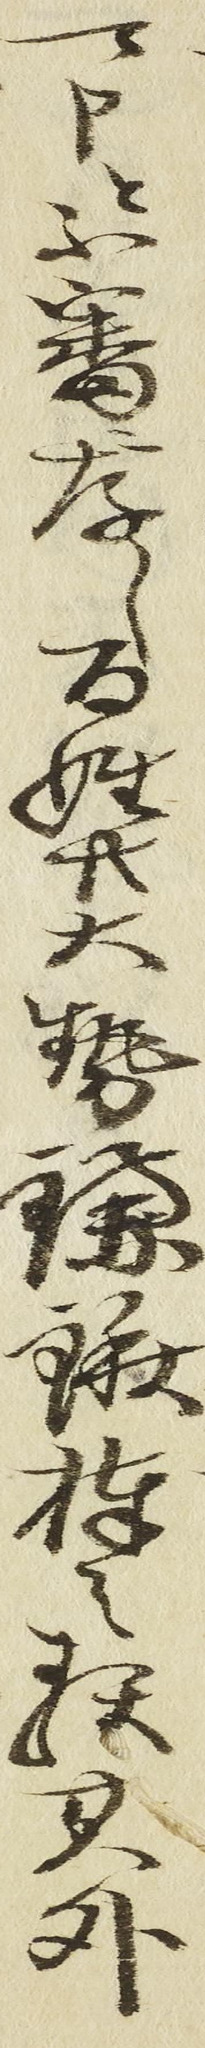可申と不審に存し百姓共大勢鎌鍬棒之類其外
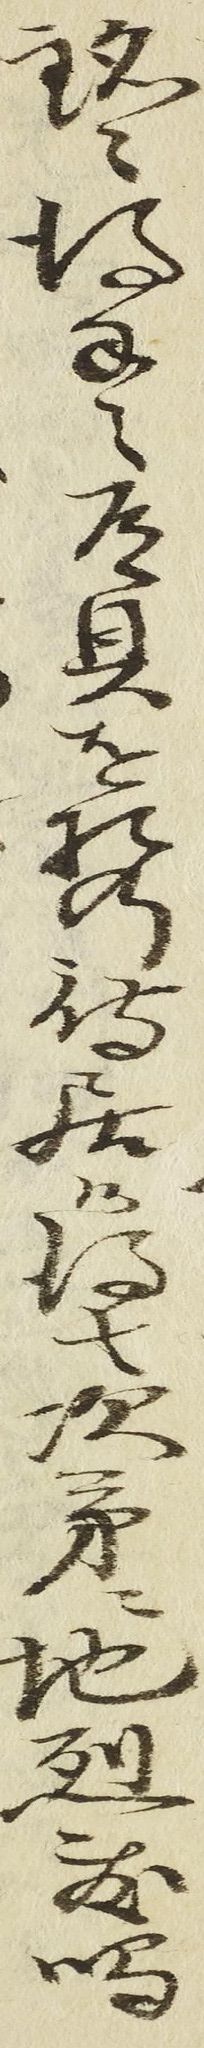銘々得手之道具を携待居候得は次第二地烈敷鳴
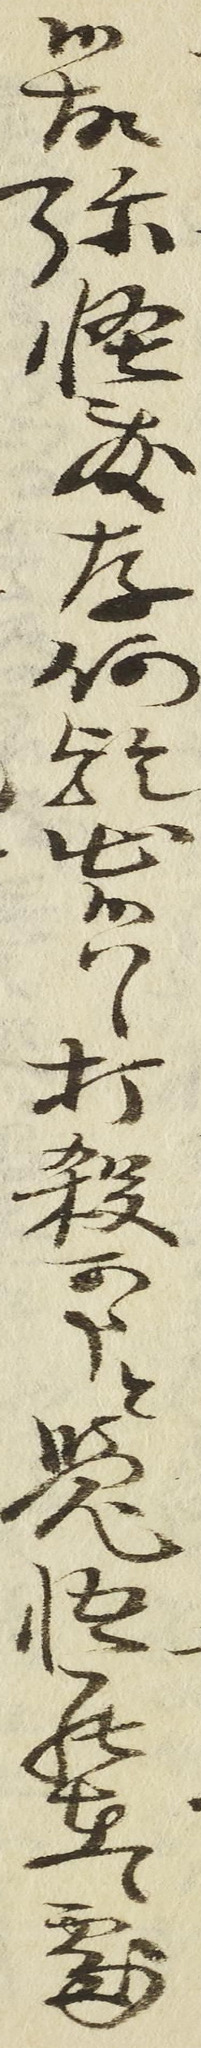候故弥怪敷存何か出候ハゝ打殺可申と覚悟罷在候処
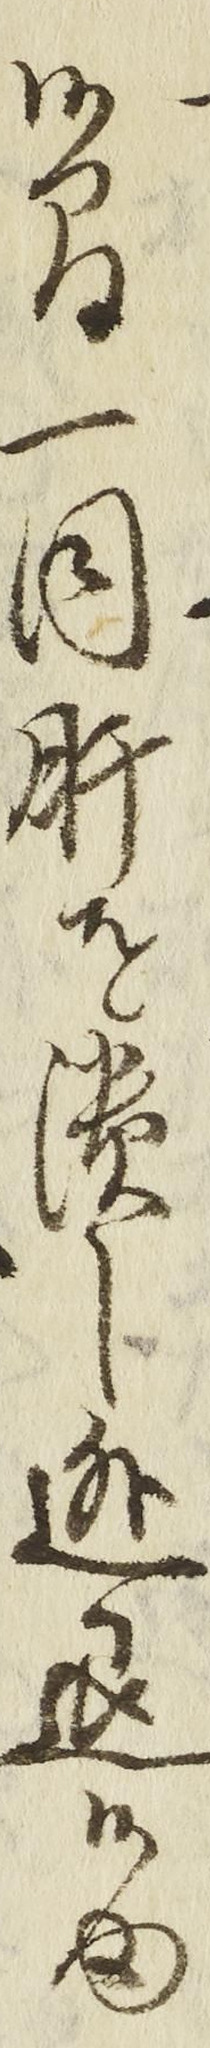候間一同肝を潰し逃退候由
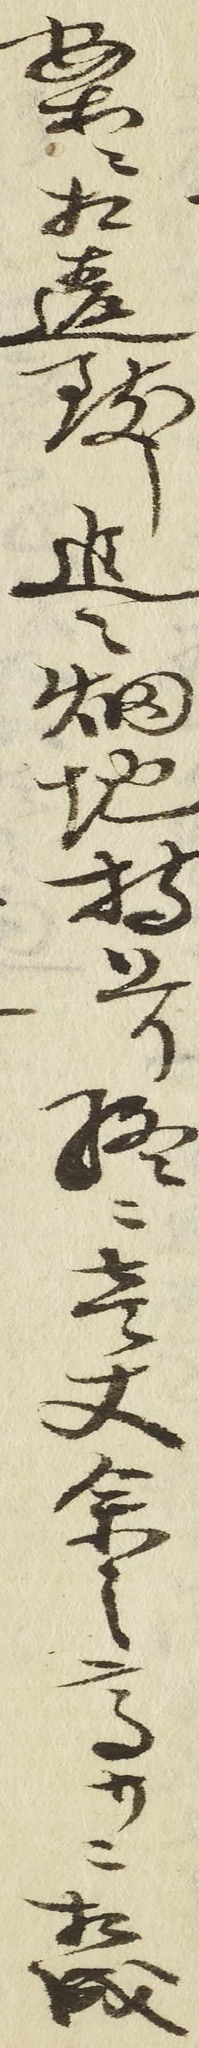案二相違致し追々畑地持上り終二壱丈余之高サ二相成
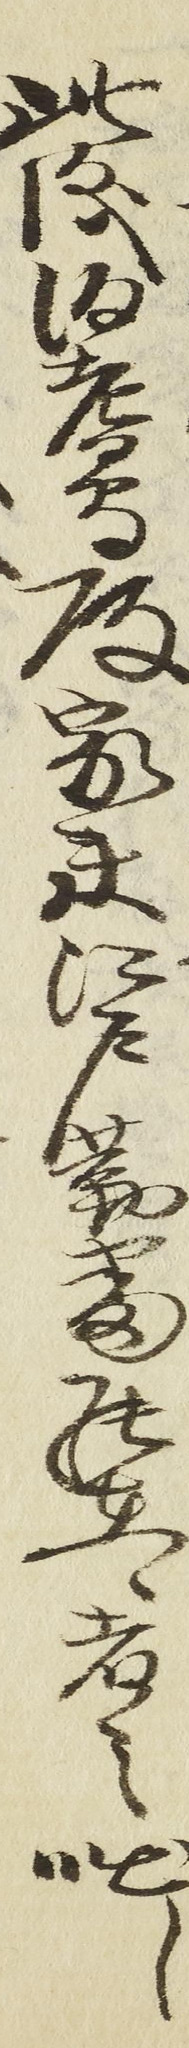此の儀伯耆守殿家来江戸勤番罷在候者之咄し
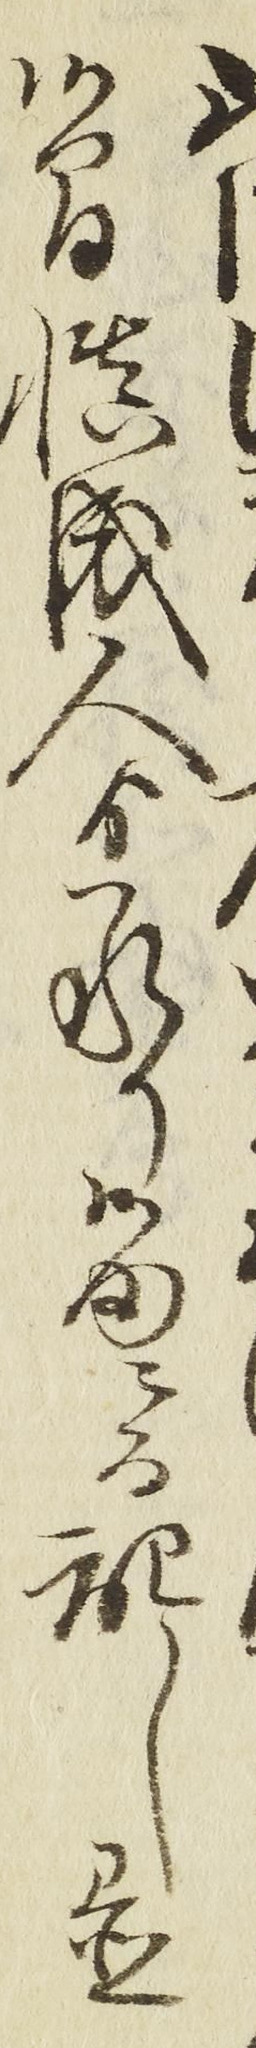候間慥成人ゟ承り候由二而記し置

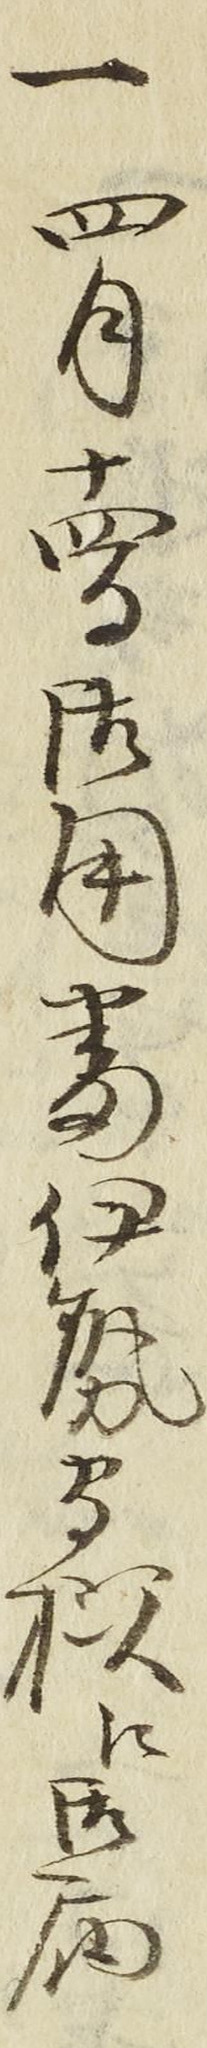一四月十四日御用番伊勢守様江御届
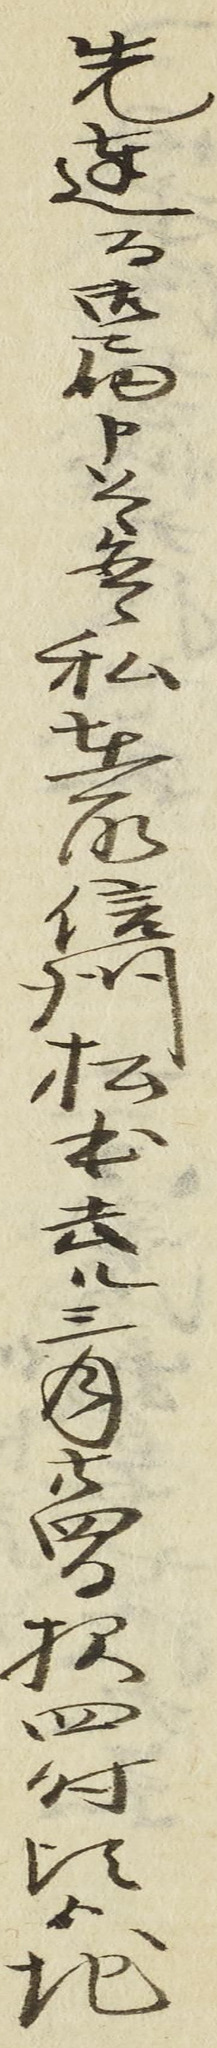先達而御届申上置候私在所信州松本去る三月廿四日夜四時頃ゟ地
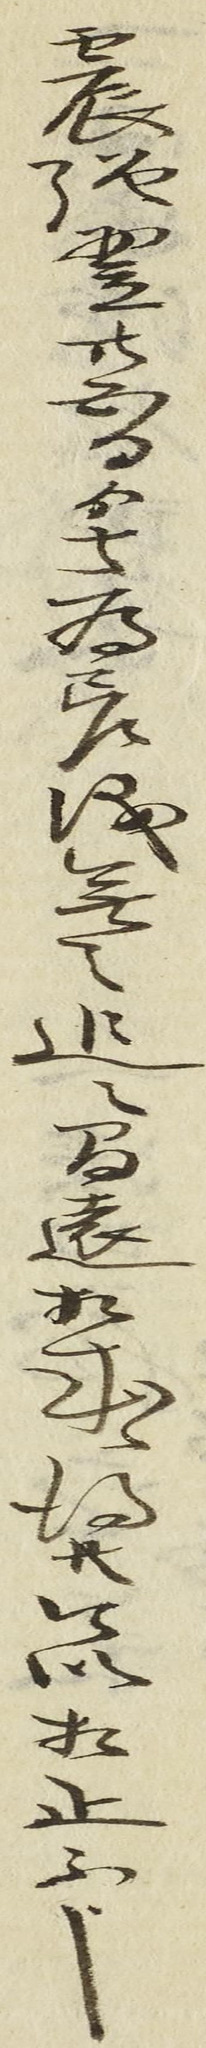震強翌廿五日ゟは為差儀無之追々間遠相成候得共今以止不申
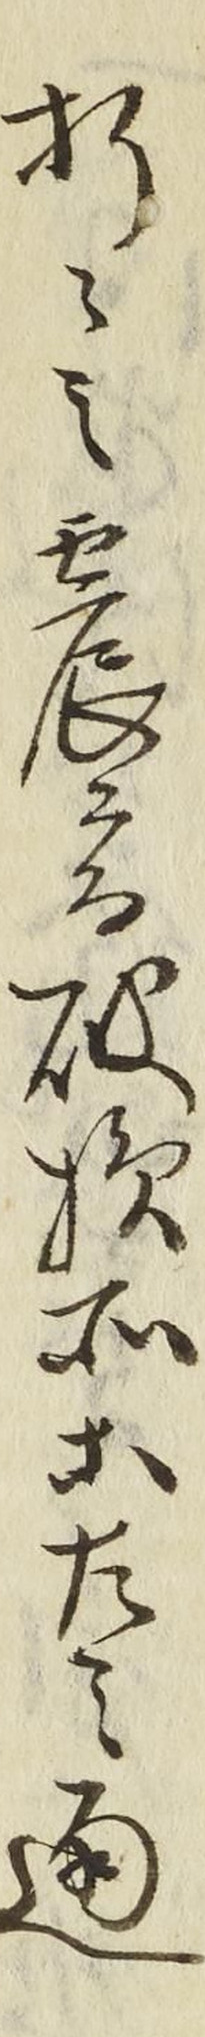折々は震候而破損所等左之通
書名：信濃國大地震記　乾
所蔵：東京大学地震研究所図書室 Earthquake Research Institute Library, The University of Tokyo, JAPAN
